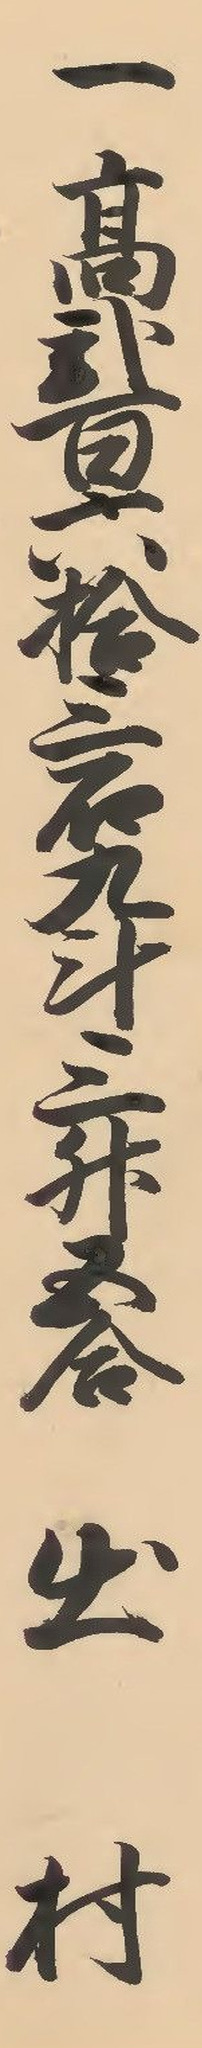一髙弐百六拾三石九斗三升五合出村

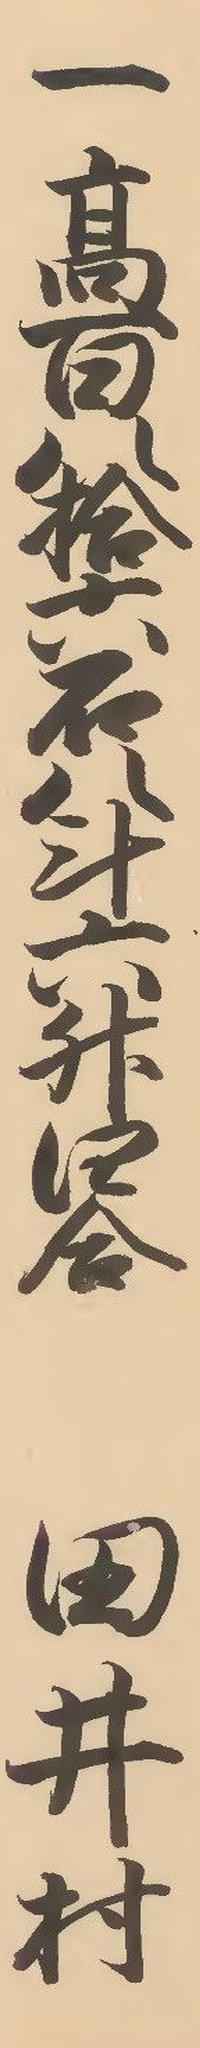一髙百八拾六石八斗六升四合田井村
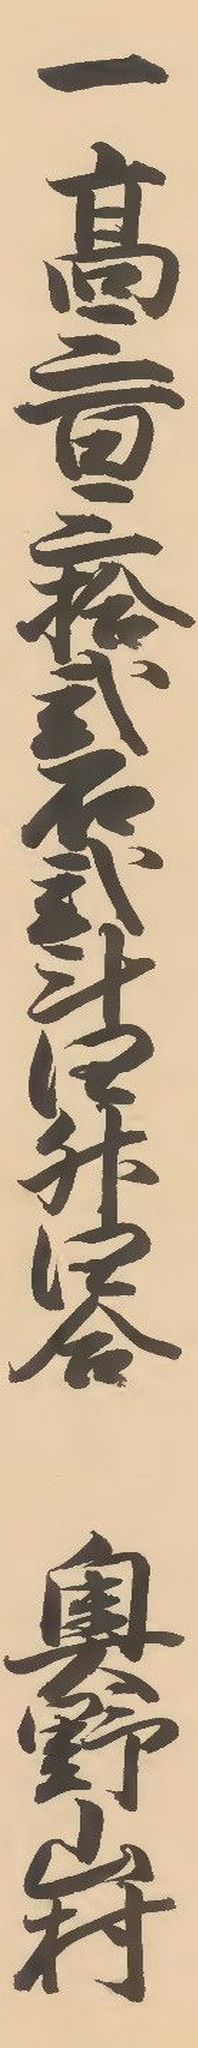一髙三百三拾弐石弐斗四升四合奥野山村
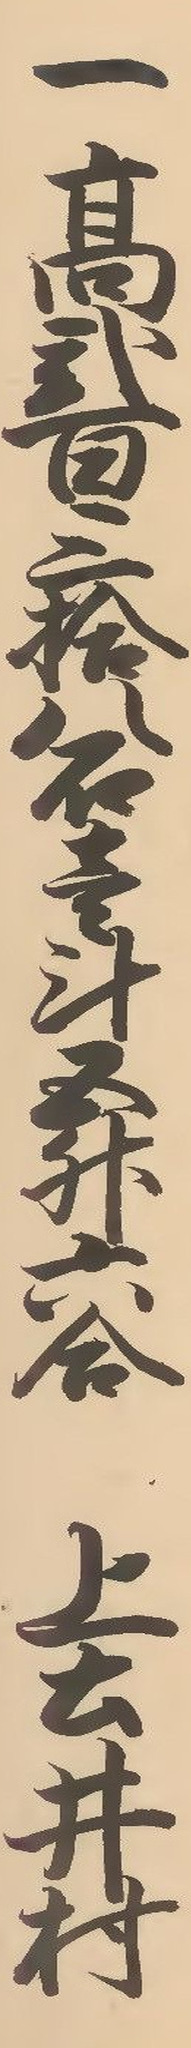一髙弐百三拾八石壱斗五升六合上土井村
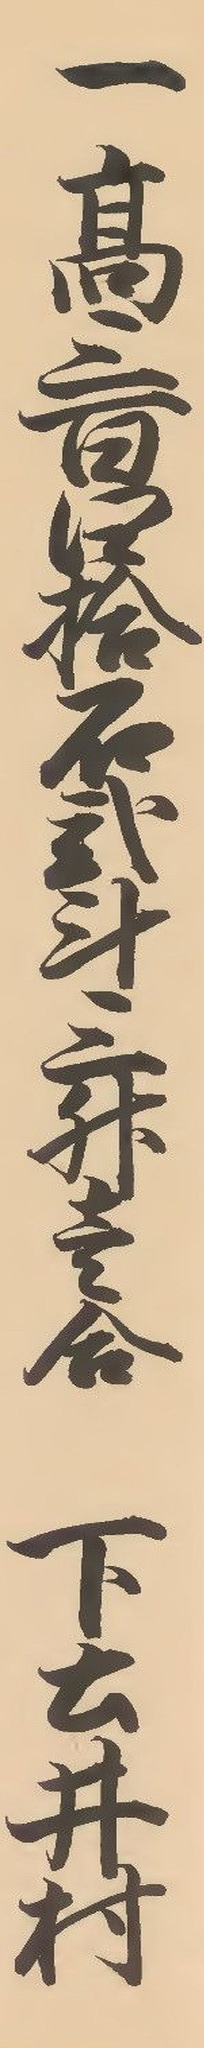一髙三百四拾石弐斗三升壱合下土井村
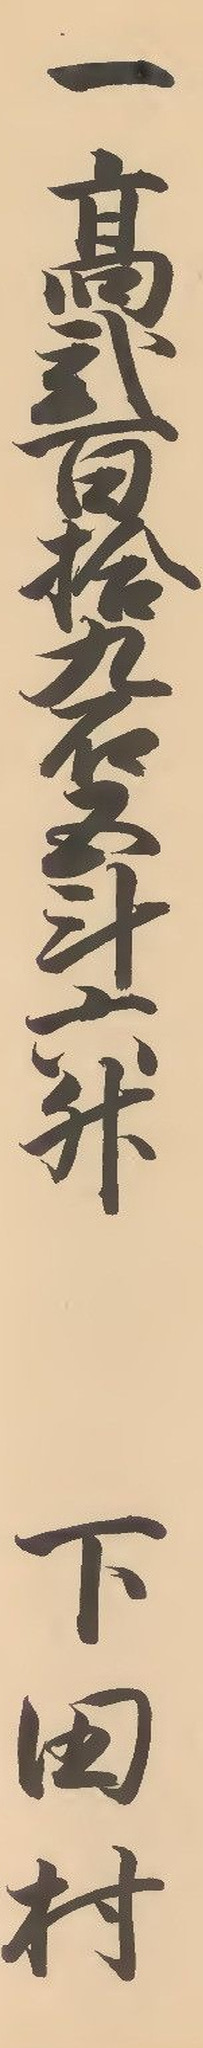一髙弐百拾九石五斗六升下田村
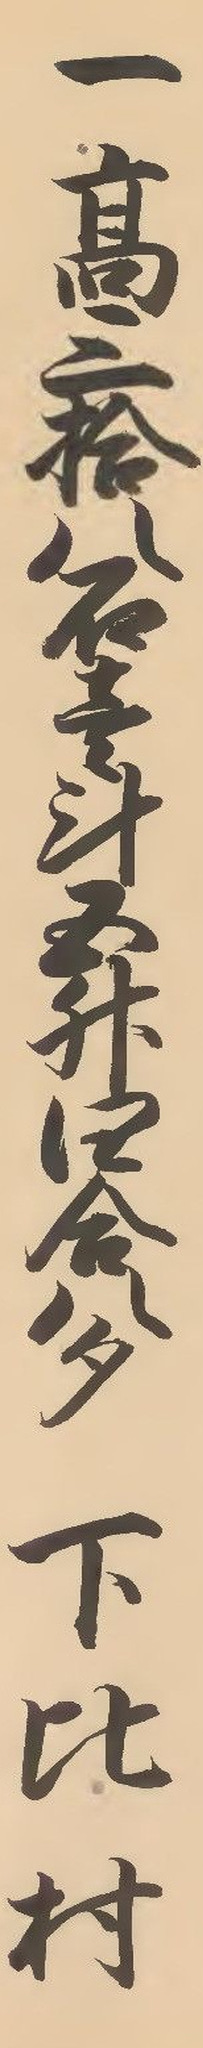一髙三拾八石壱斗五升四合八夕下比村
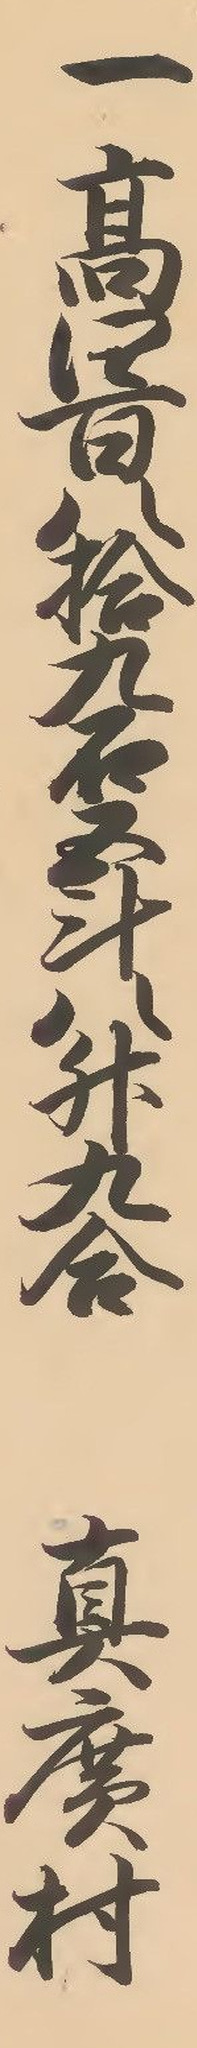一髙四百八拾九石五斗八升九合真廣村

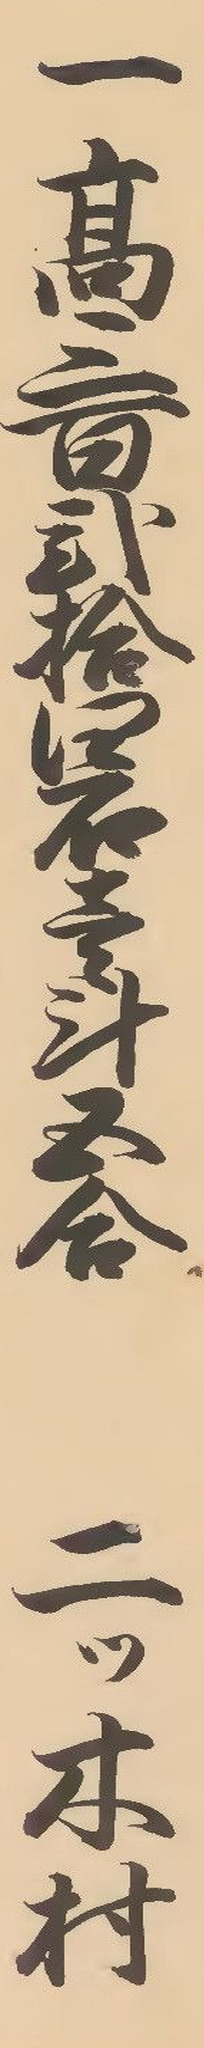一髙三百弐拾四石壱斗五合二ツ木村
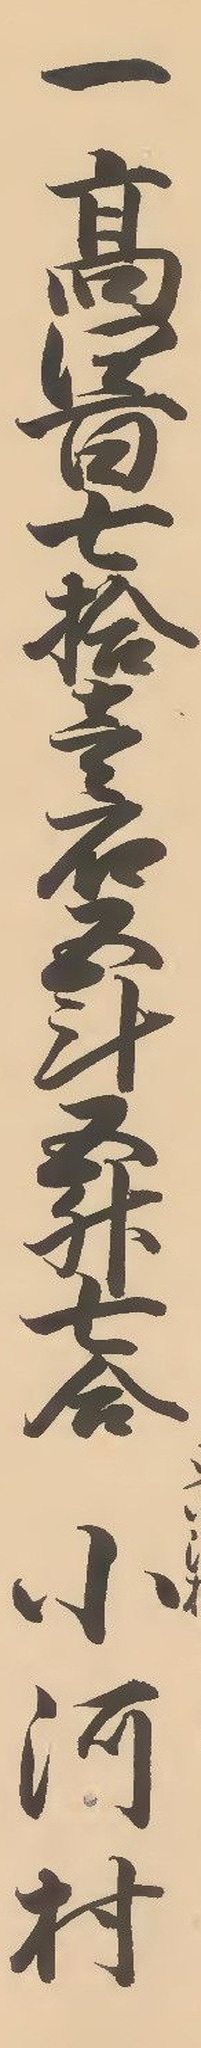一髙四百七拾壱石五斗五升七合小河村
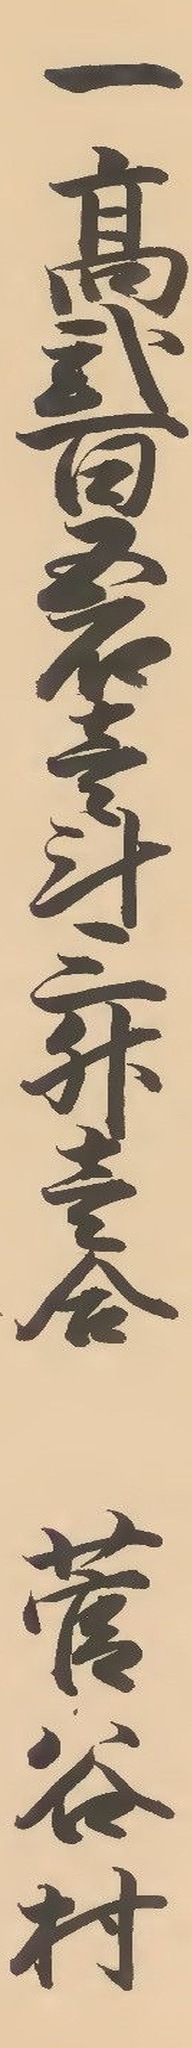一髙弐百五石壱斗三升壱合菅谷村
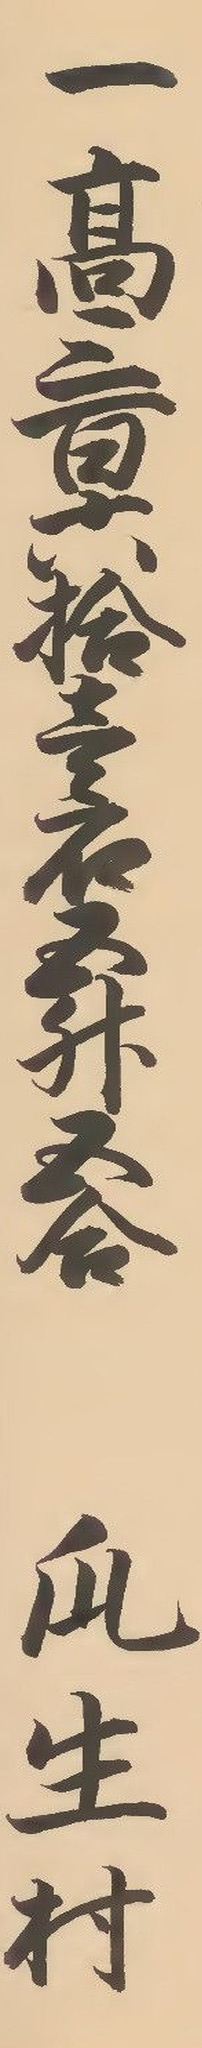一髙三百六拾壱石五升五合瓜生村
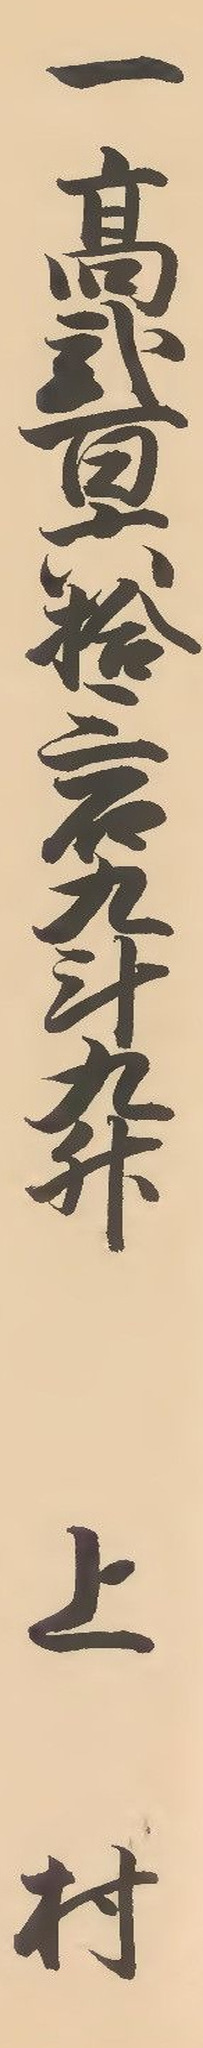一髙弐百六拾三石九斗九升上村
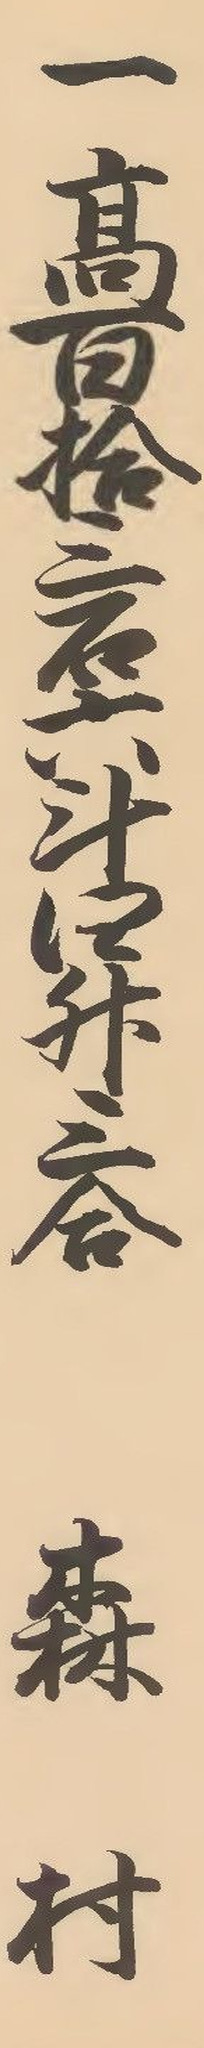一髙百拾三石六斗四升三合森村
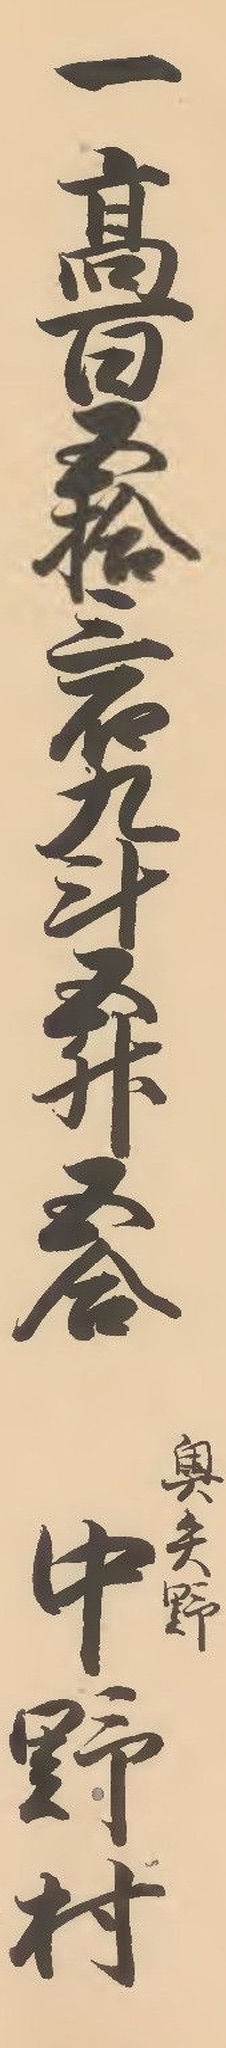一髙百五拾三石九斗五升五合中野村
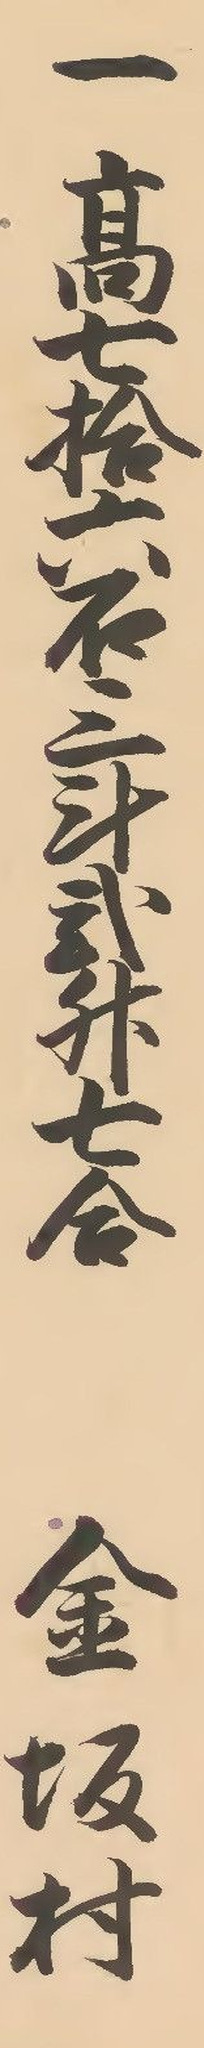一髙七拾六石三斗弐升七合金坂村
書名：播磨国郷帳
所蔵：国立公文書館 National Archives of Japan
